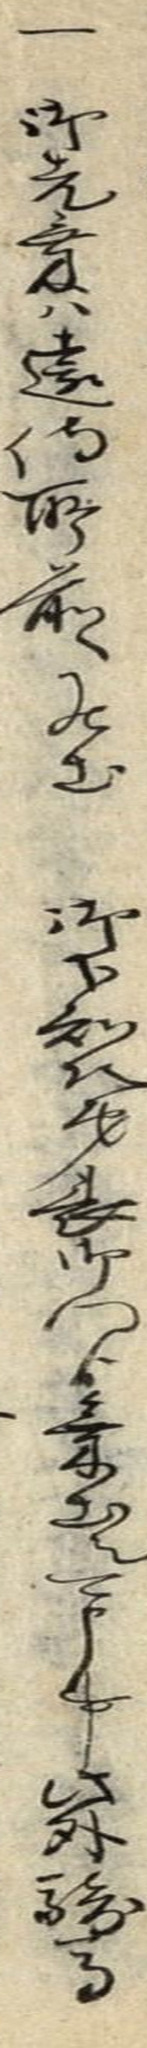一御先乗は遠侍所前へ罷出御下知次第表御門ゟ乗出し可申事此外騎馬
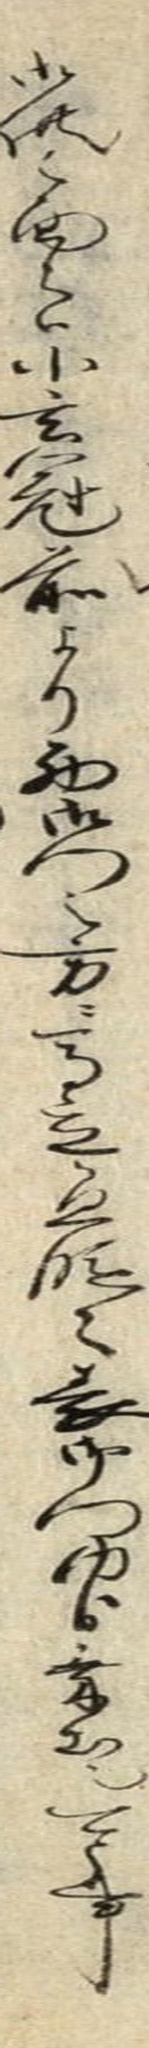御供之面々は小玄冠前より西御門之方に馬立置段々表御門内ゟ乗出し可申事
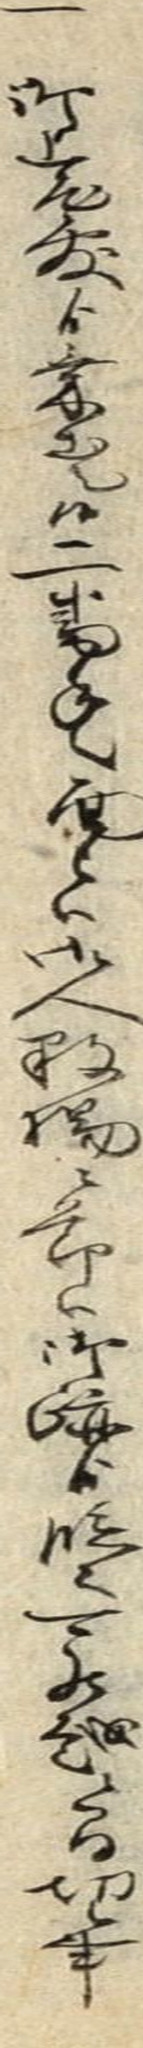一御上屋敷ゟ乗出し候二番手之面々は御人数場候節は御跡ゟ段々可罷越候間切候事
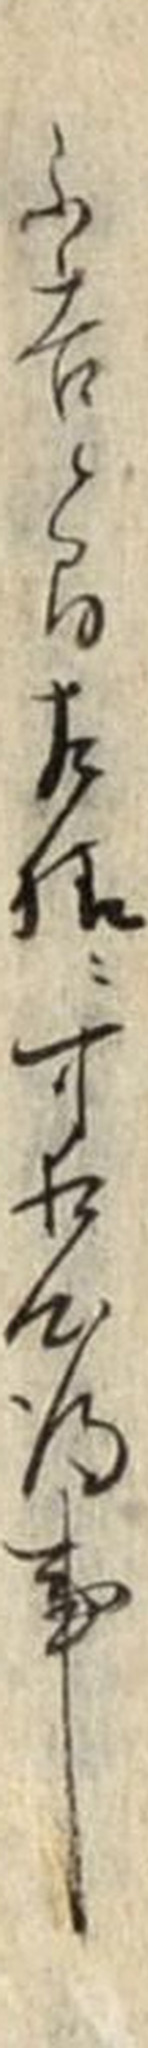不苦候間左様に可相心得事
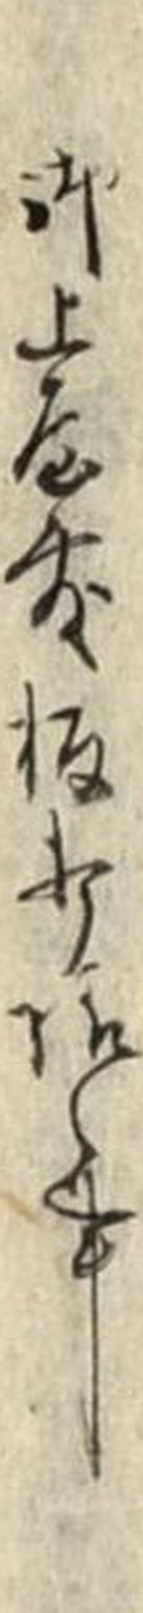御上屋敷板打様之事
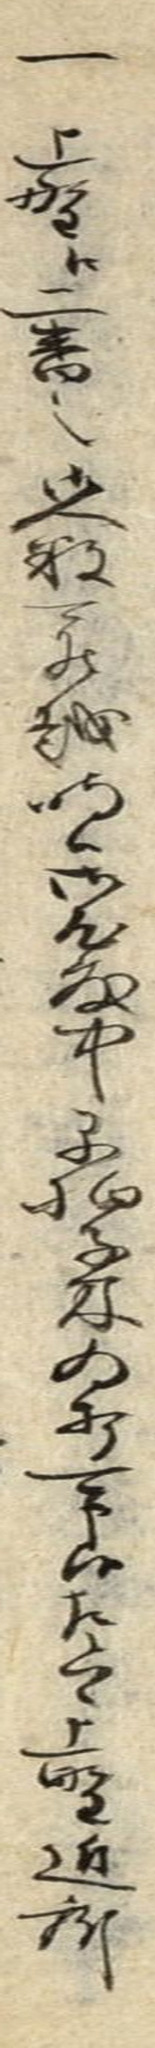一上野江二番之御人数可罷越時は御屋敷中早拍子木為打可申候左候はゝ上野近所
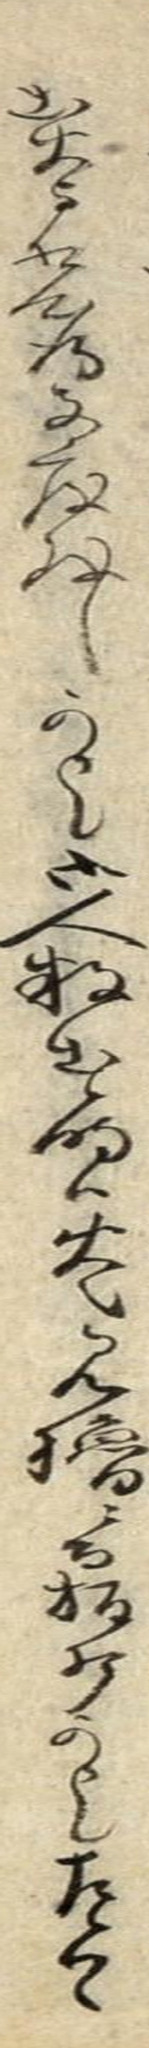出火と相心得支度致し可申候御人数出候時は火之見櫓にて板打可申候左候はゝ
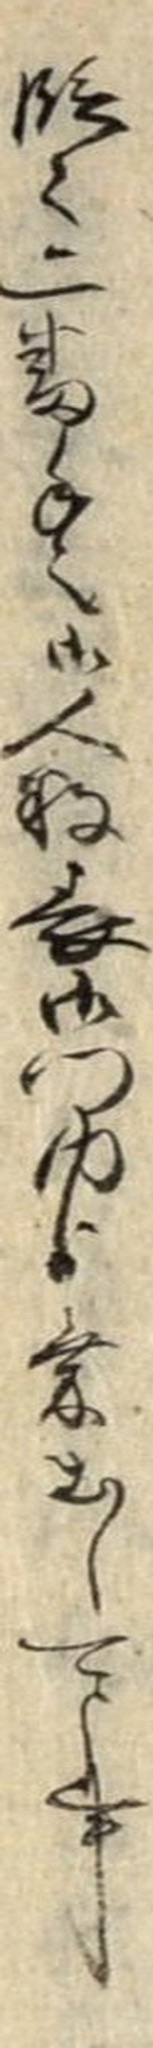段々二番手之御人数表御門内ゟ乗出し可申事
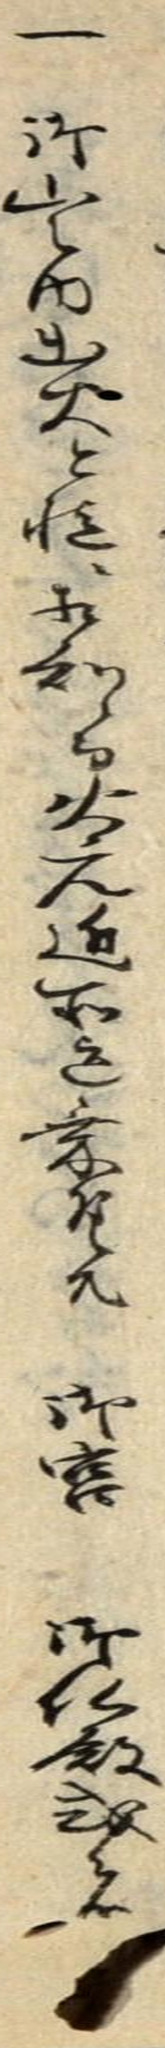一御山之内出火と慥に相知候て火元近所迄乗付候供御宮御仏殿或は

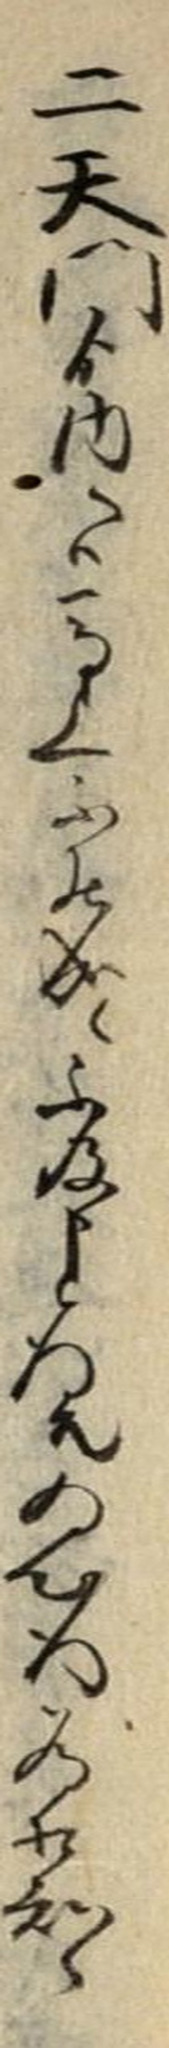二天門ゟ内へは馬上不罷成候不及申候得共為心得為相知候
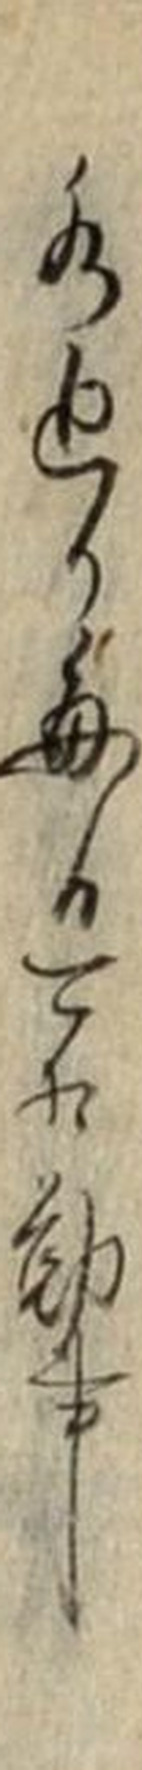一水廻り毎日可相勤事
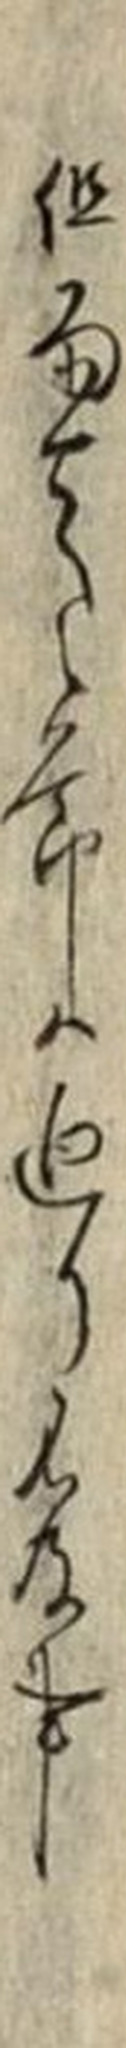但雨天之節は廻り不及事
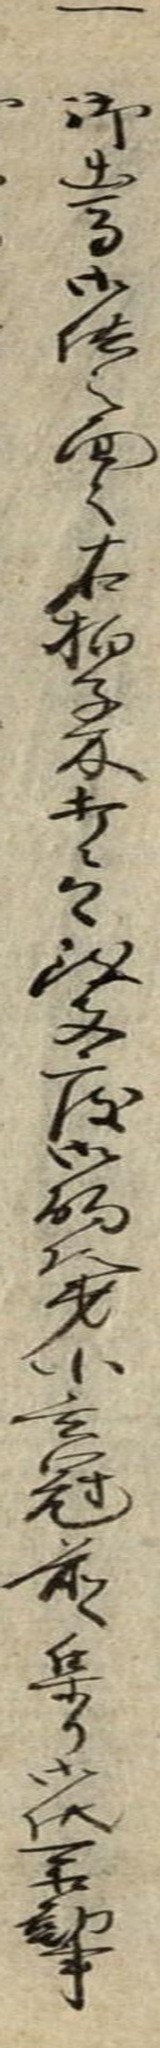一御出馬御供之面々右拍子木打候はゝ致支度御触次第小玄冠前へ集り御供可相勤事
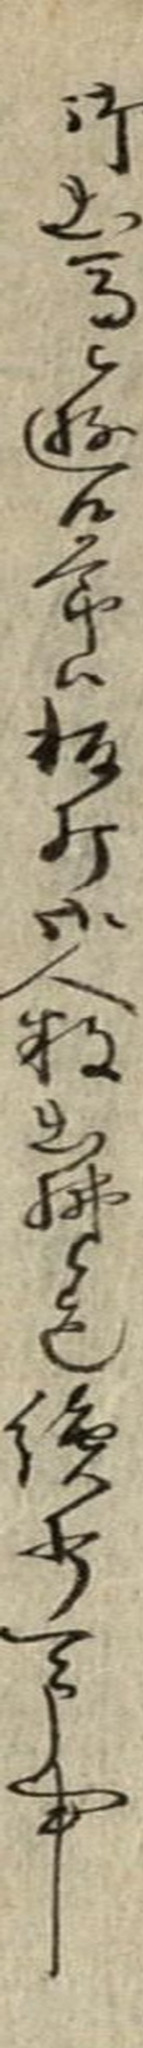御出馬被遊候節は板打御人数出払候迄続打可申事
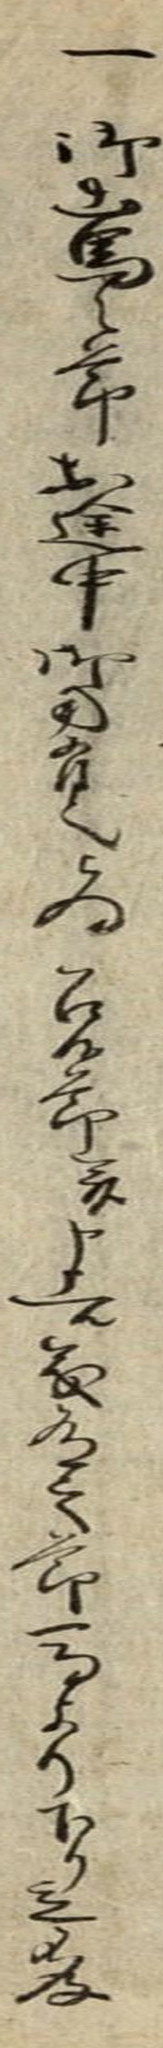御出馬之節於途中御用有之被為召候節并申上る義有之節馬より下り立不及
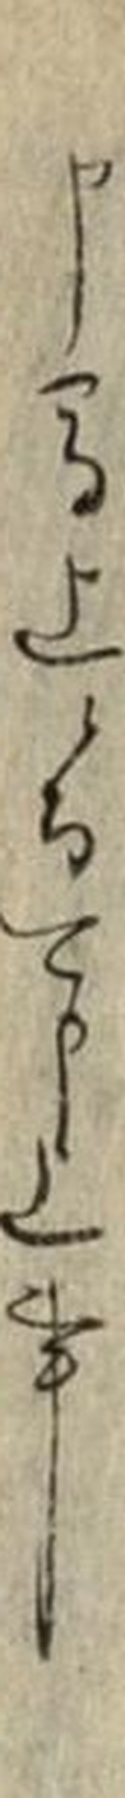申馬上にて可申上事
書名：三都并道中之部
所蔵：福井県文書館 Fukui Prefectural Archives
